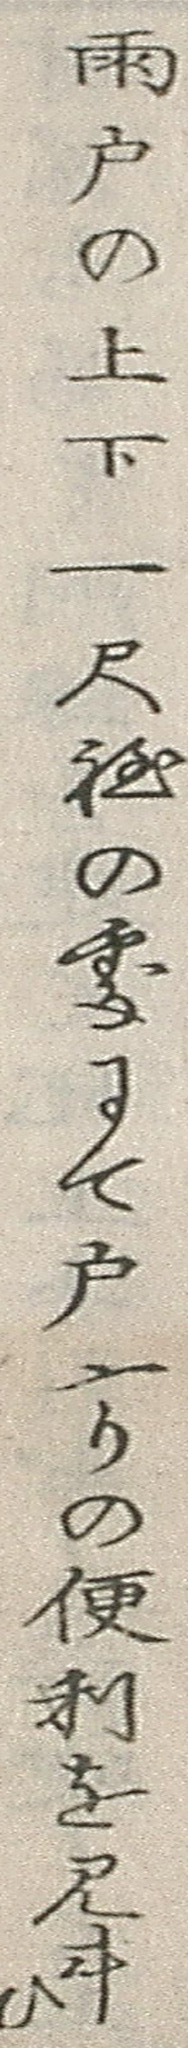雨戸の上下一尺程の処にて戸〆りの便利を見斗ひ
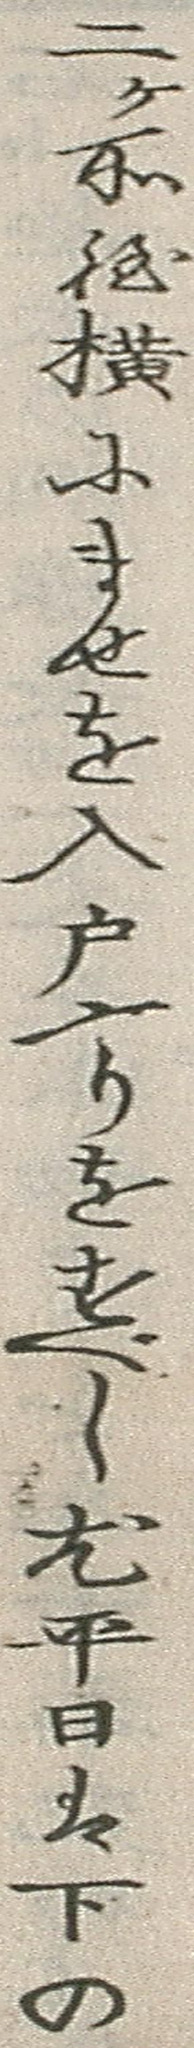二ケ所程横にませを入戸〆りをすべし尤平日は下の
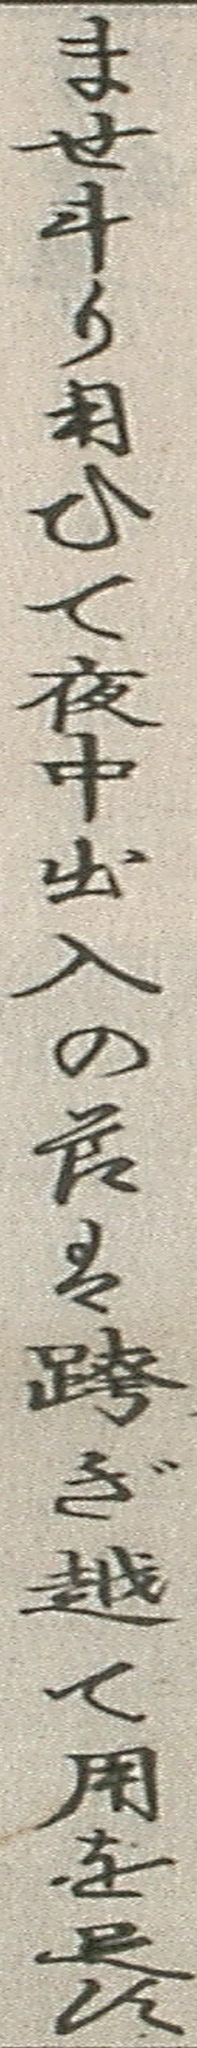ませ斗り用ひて夜中出入の節は跨ぎ越て用を足す
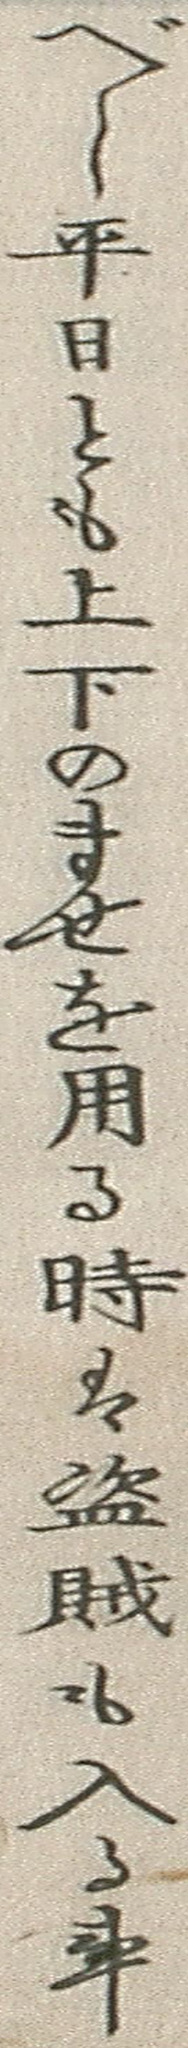べし平日とも上下のませを用る時は盗賊も入る事
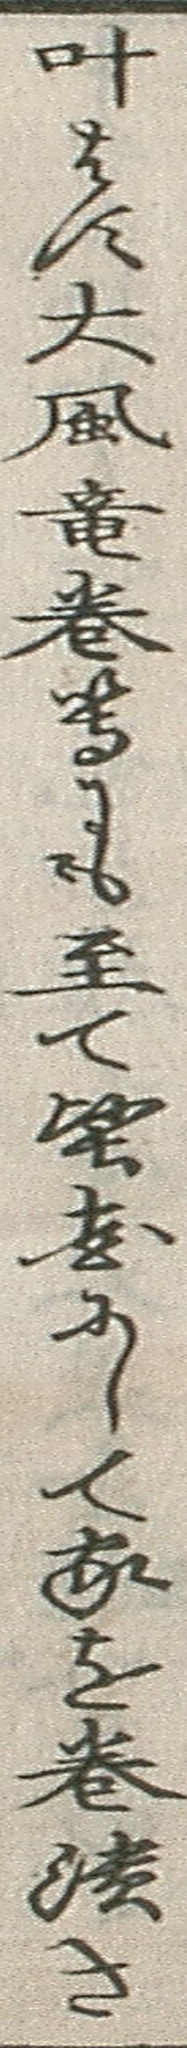叶はす大風竜巻等にも至て堅固にして家を巻潰さ
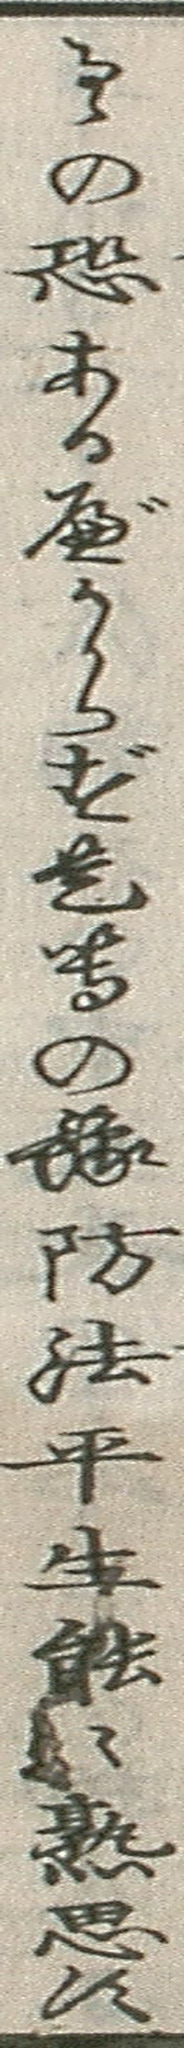るゝの恐あるべからず是等の予防法平生能〻熟思す
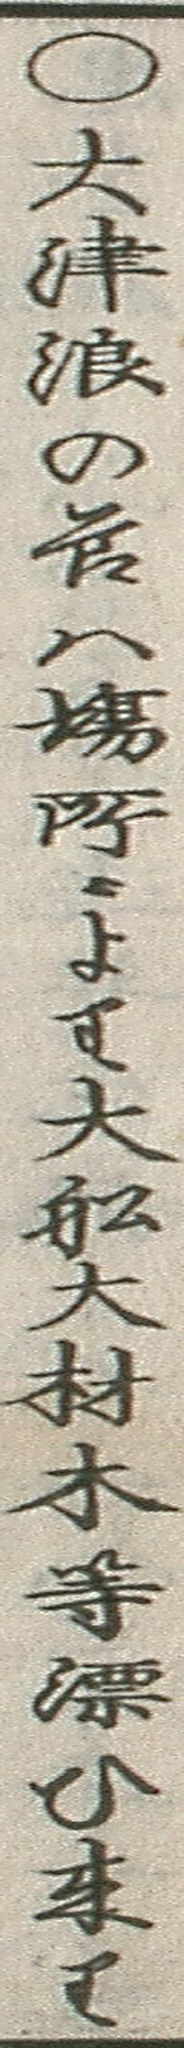〇大津浪の節は場所大船大材木等漂ひ来り
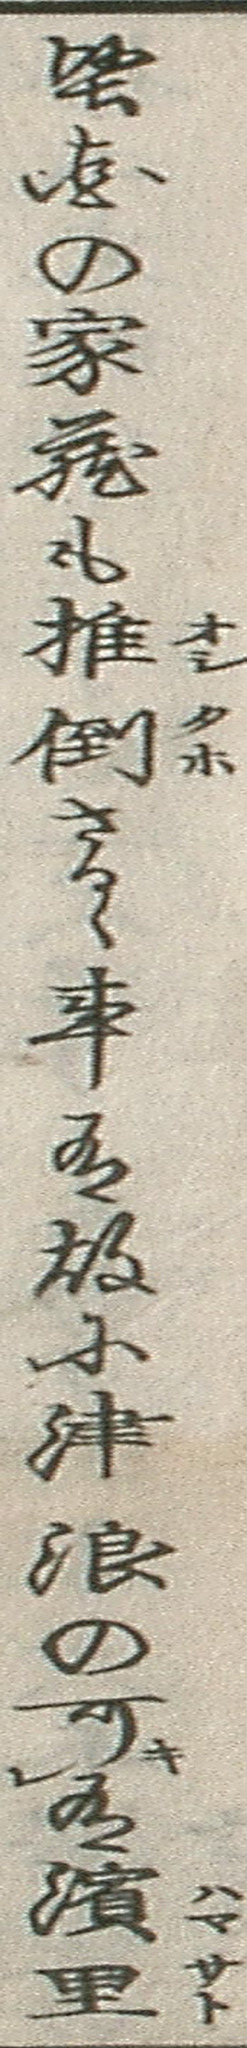堅固の家蔵も推倒さるゝ事有故に津浪の可有浜里
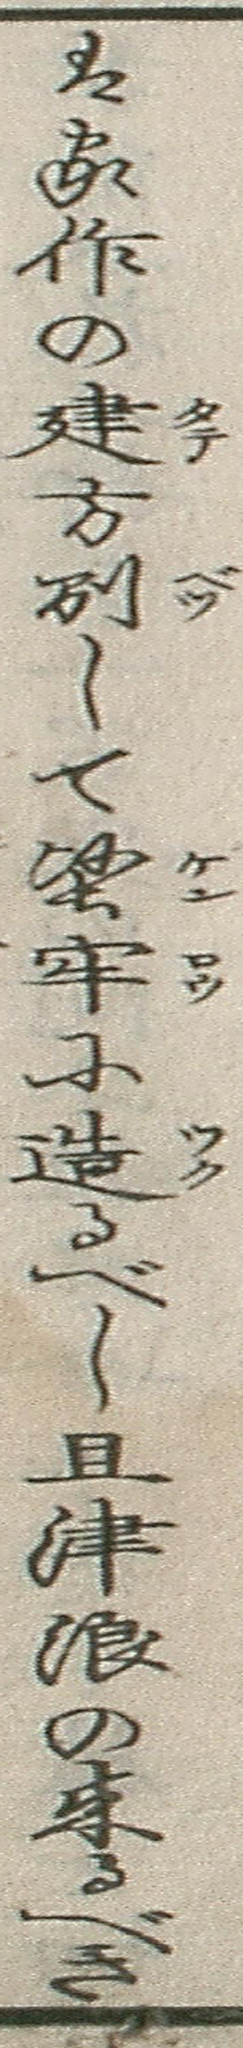は家作の建方別して堅牢に造るべし且津浪の来るべき

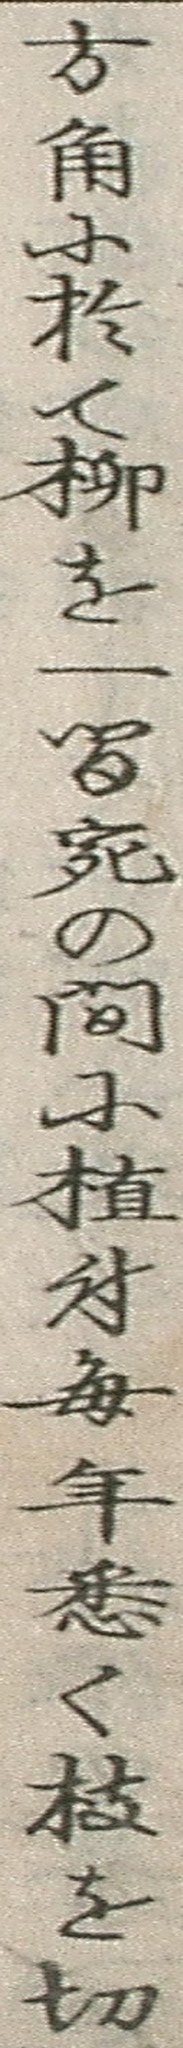方角に於て柳を一間宛の間に植付毎年悉く枝を切
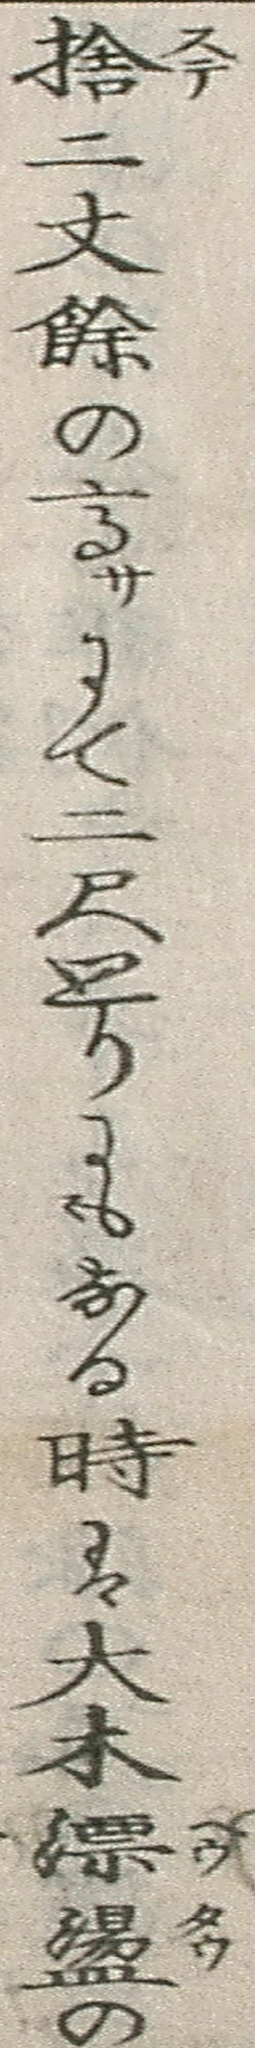捨二丈余の高二尺廻りにもなる時は大木漂盪の
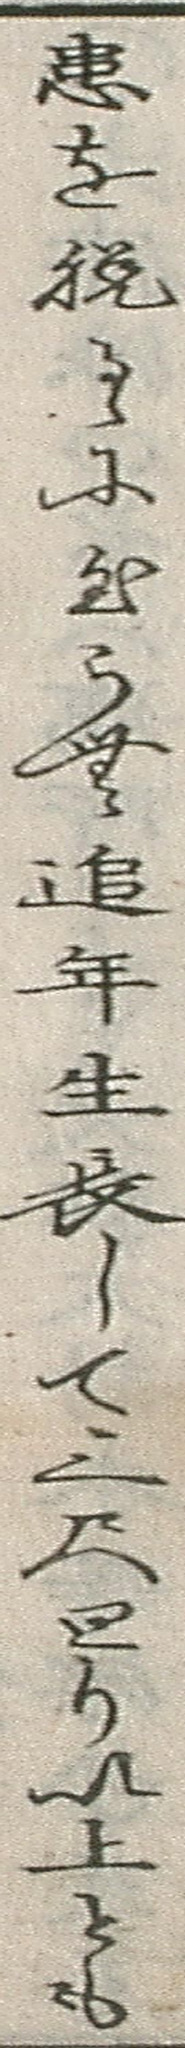患を脱るゝに至らむ追年生長して三尺廻り以上とも
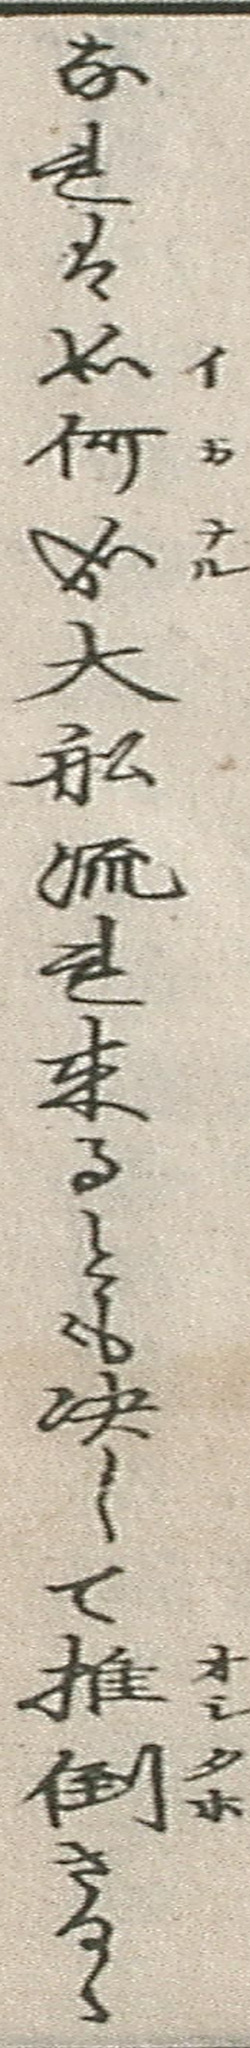なれは如何成大船流れ来るとも決して推倒さるゝ
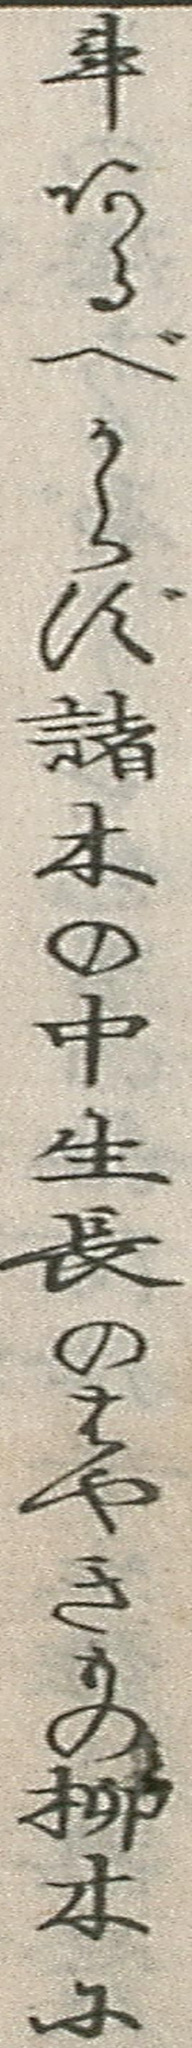事あるべからず諸木の中生長のはやきもの柳木に
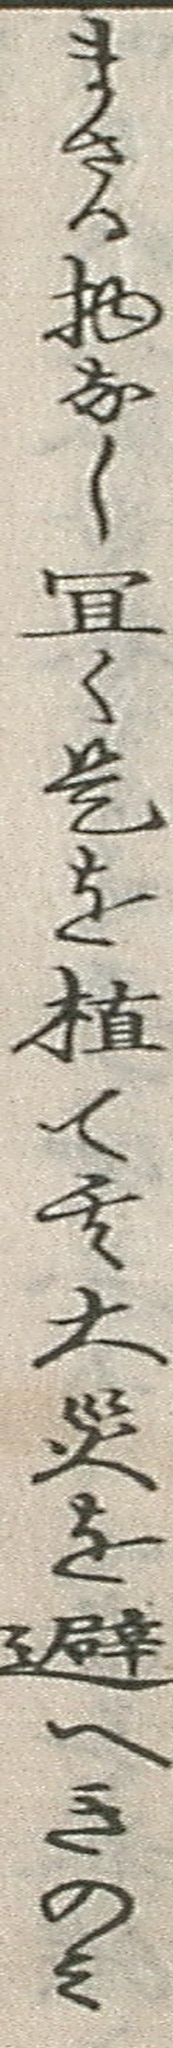まさる物なし宜く是を植て其大災を避べきのみ
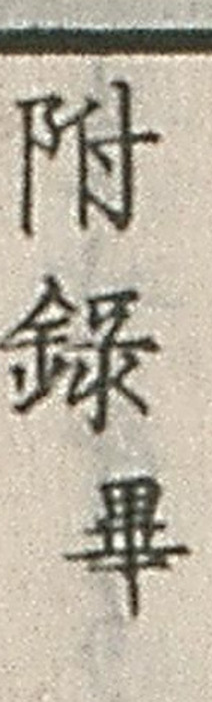附録畢
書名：附録　地震劇風災害豫防法圖説（内題）
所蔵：東京大学地震研究所図書室 Earthquake Research Institute Library, The University of Tokyo, JAPAN
